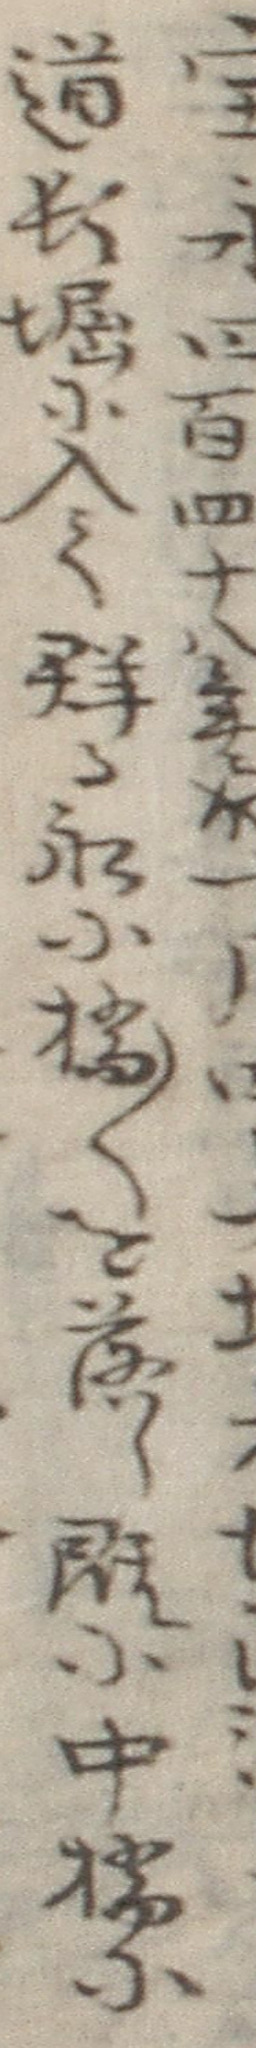道頓堀に入て群る舩に橋〱を落はし既に中橋に
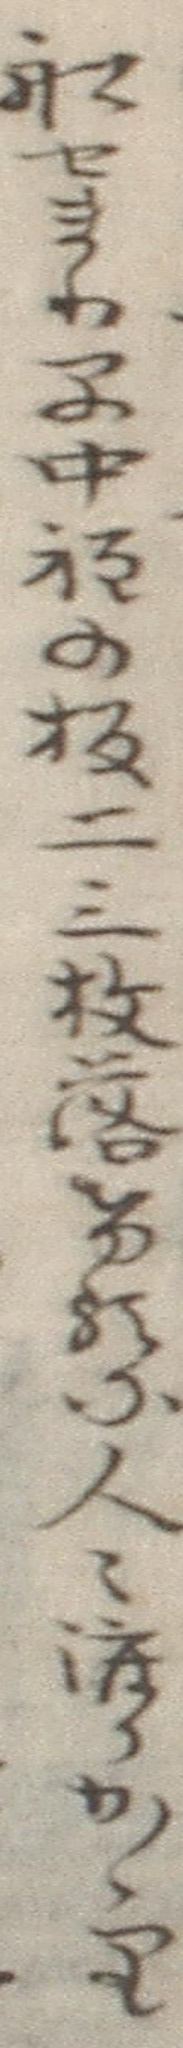舩せまり早中程の板二三枚落けるに人々渡りかゝり
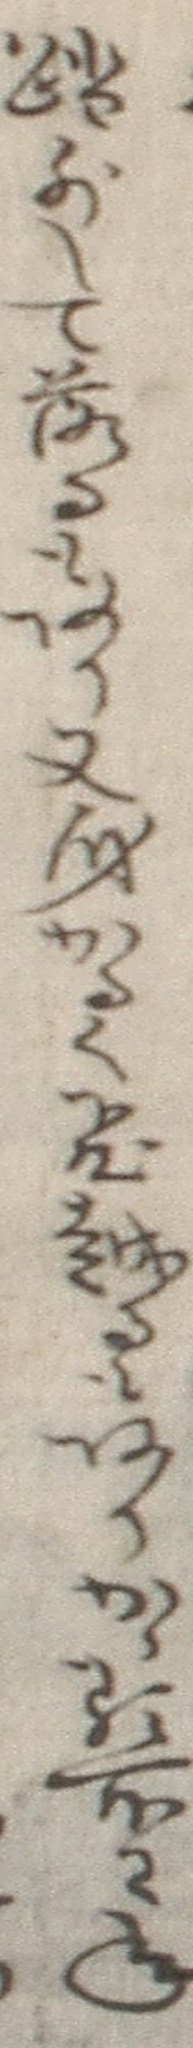踏外して落るもあり又身かるく飛越るもありかゝる所に年
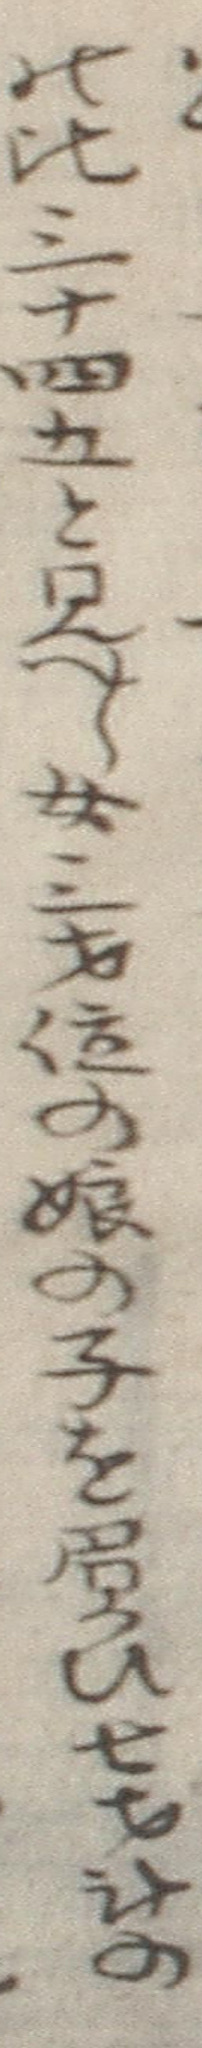の比三十四五と見へし女三才位の娘の子を負ひ七才許の
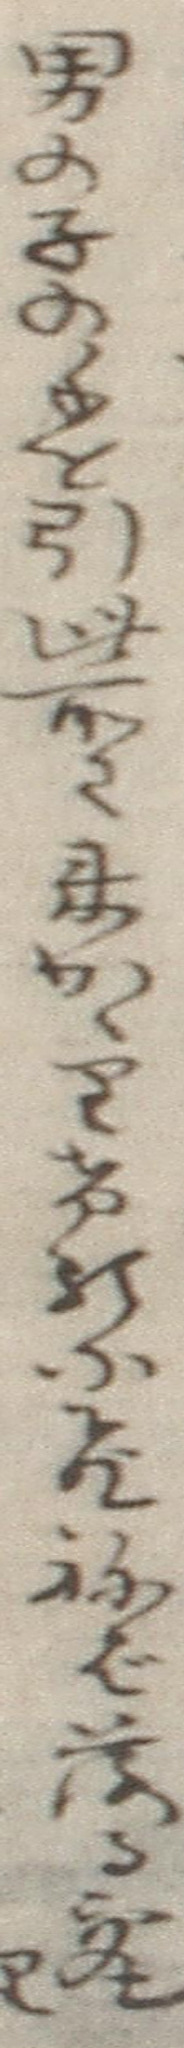男の子の手を引此所に来かゝりけるに飛ねば落る究り
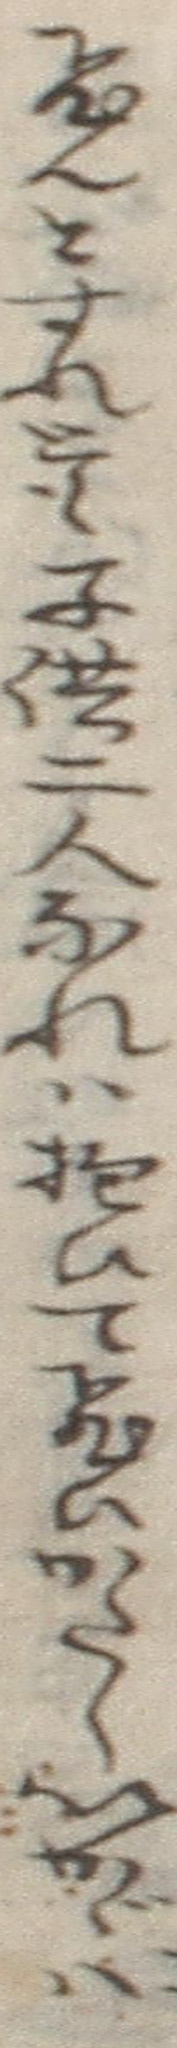飛んとすれとも子供二人なれば抱ひて飛ひかたしいかゞは
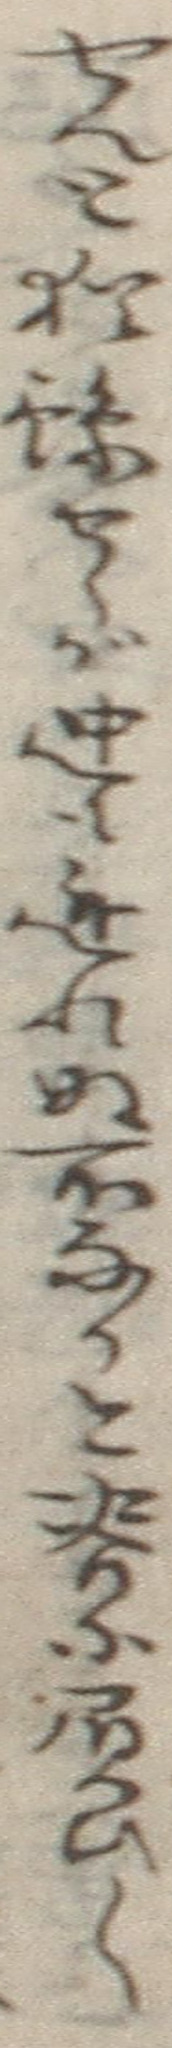せんと猶豫せしが迚も遁れぬ所なりと背に負ひし
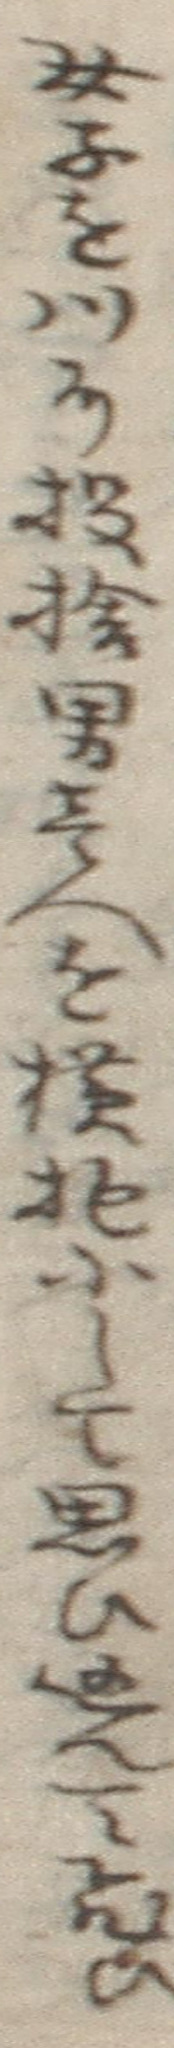女子を川に投捨男壱人を横抱にして思ひ込んて飛ひ

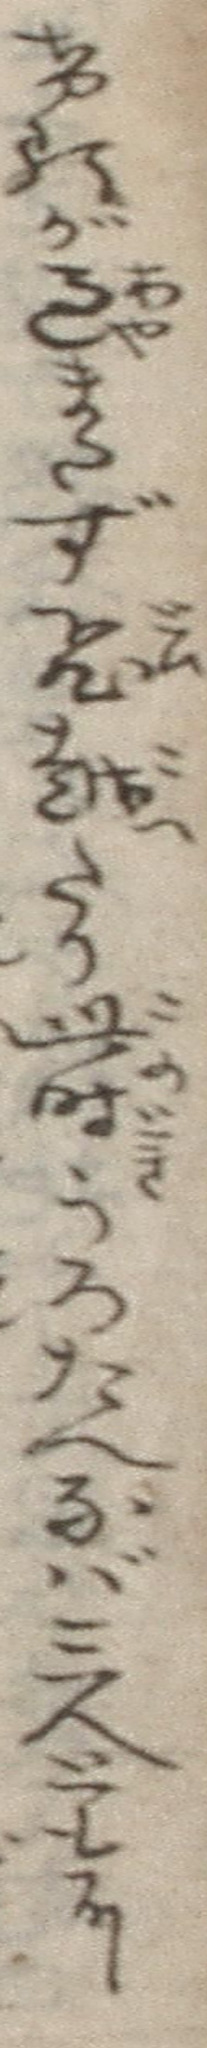けるが過またず飛越たり此時うろたへなば三人ともに
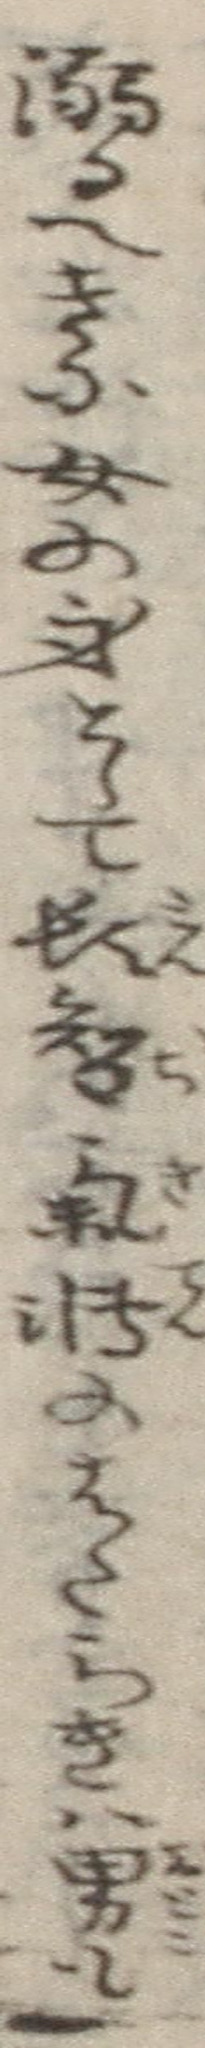溺るへきに女の身として頓智気転のはたらきは男も
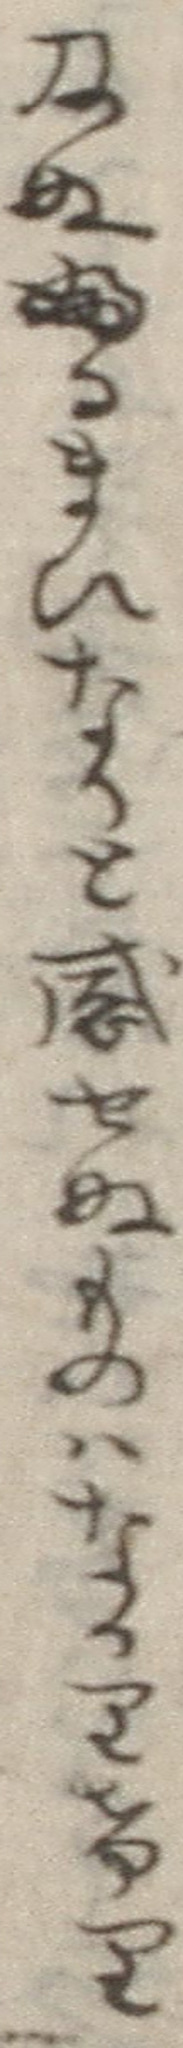及ぬふるまひなりと感せぬものはなかりけり
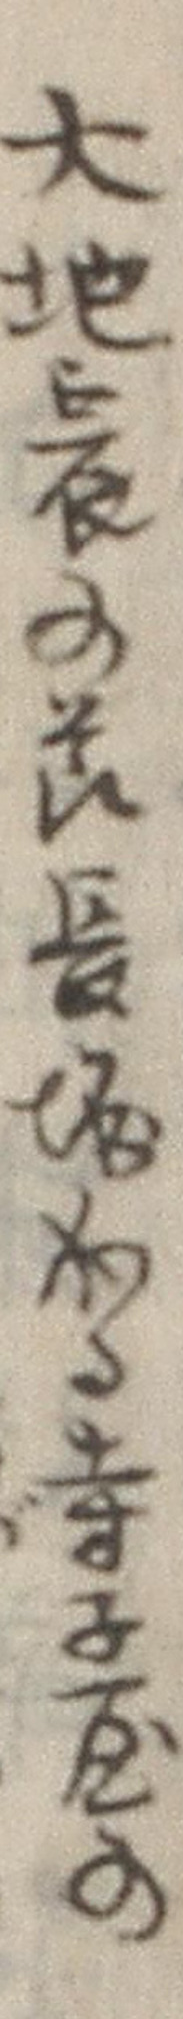大地震の節長堀成る寺小屋の
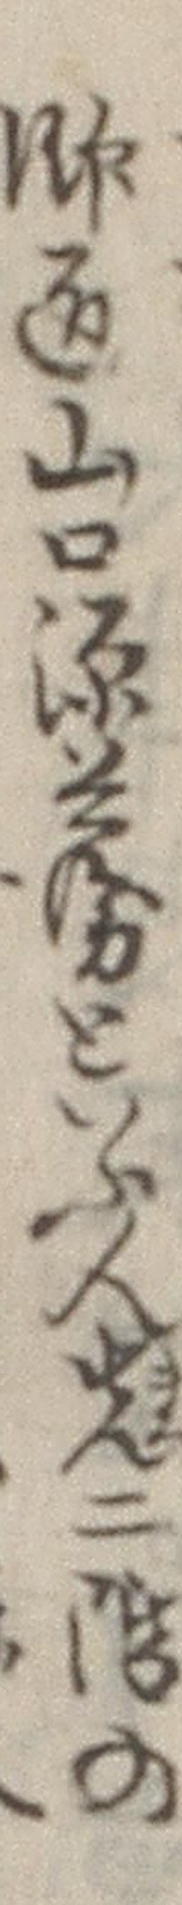師匠山口源兵衛といふ人先二階の
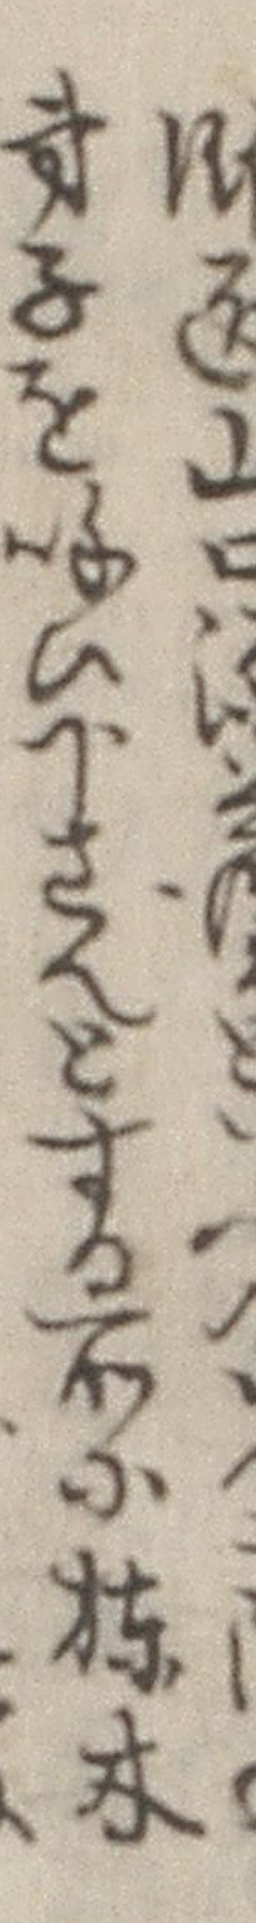弟子を呼び下さんとする所に棟木
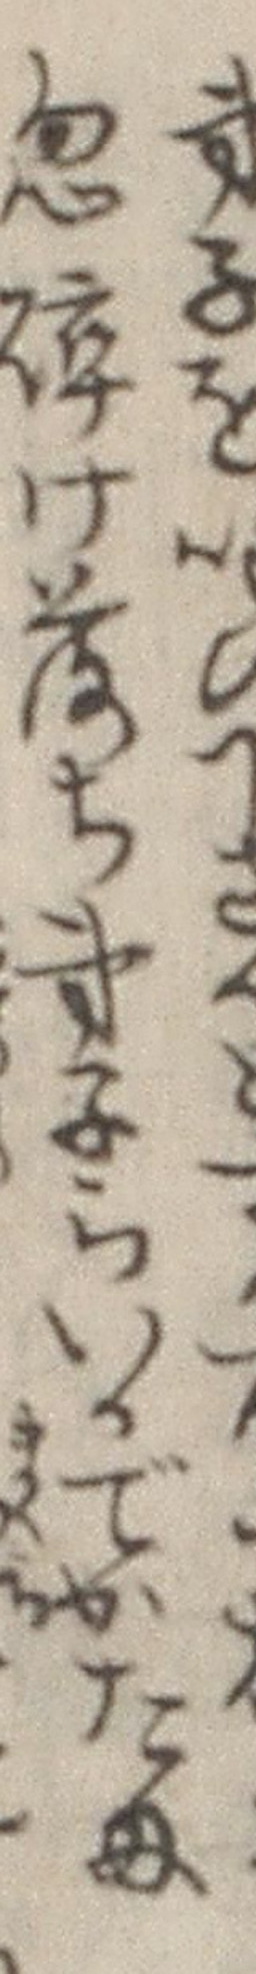忽碎け落ち弟子らいかでかたま
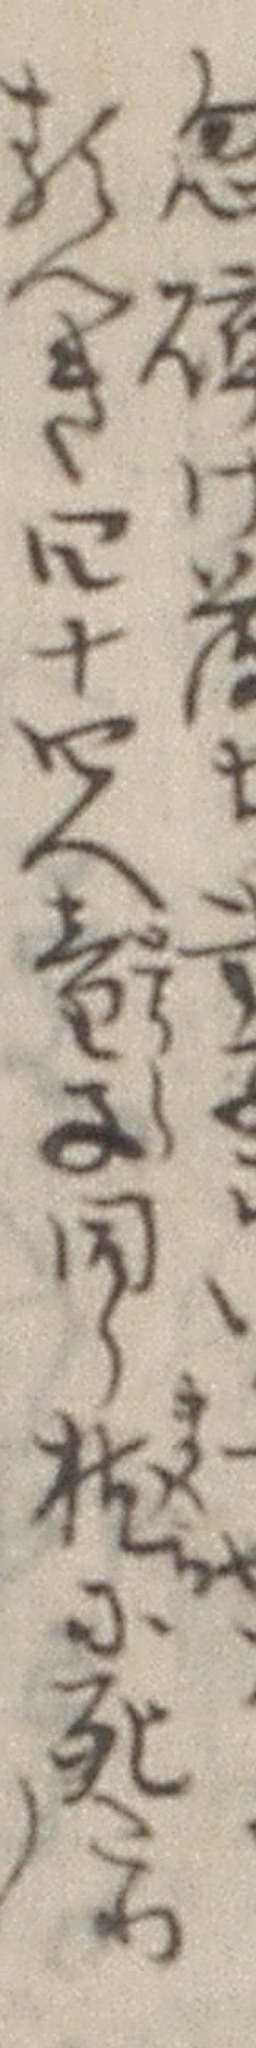るへき四十四人童子同じ枕に死たり
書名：諸國大地震年代記末代噺種
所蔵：東京大学地震研究所図書室 Earthquake Research Institute Library, The University of Tokyo, JAPAN
